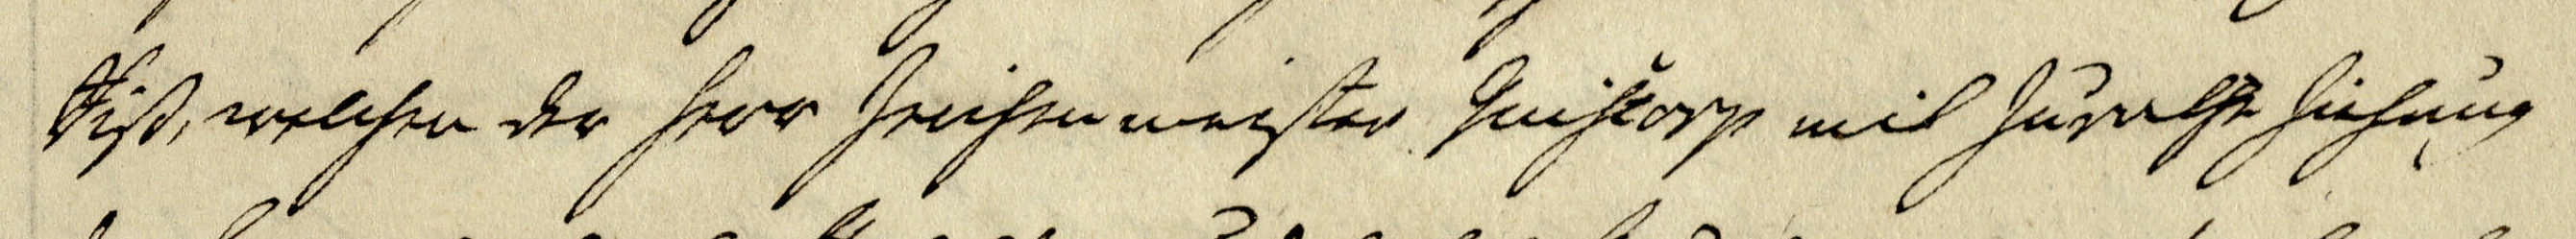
Riß, welchen der Herr Zeichenmeister Quistorp mit ZuratheZiehung
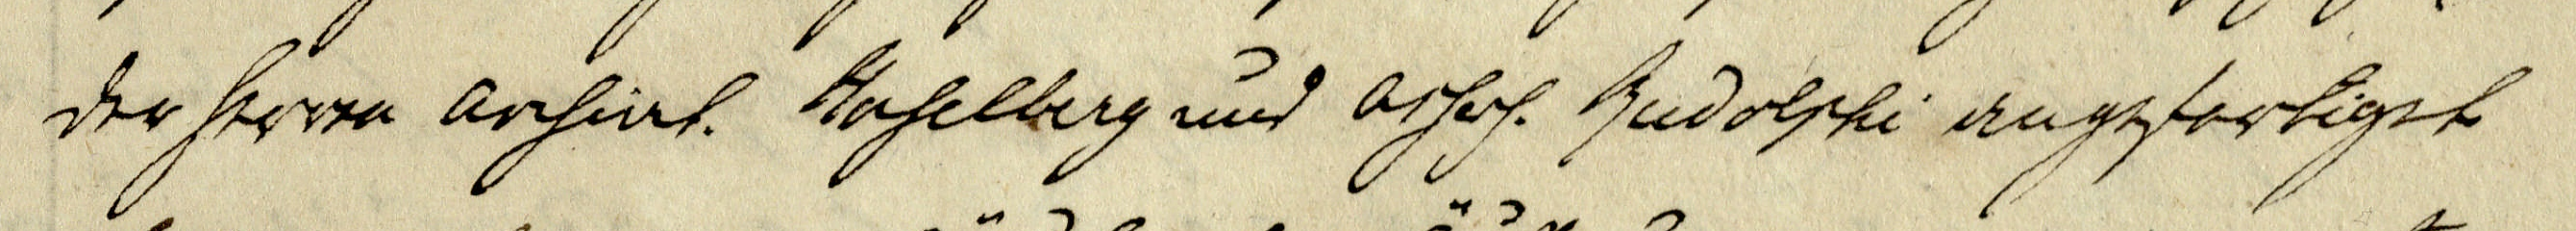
der Herren Archiat. Haselberg und Assess. Rudolphi angefertiget
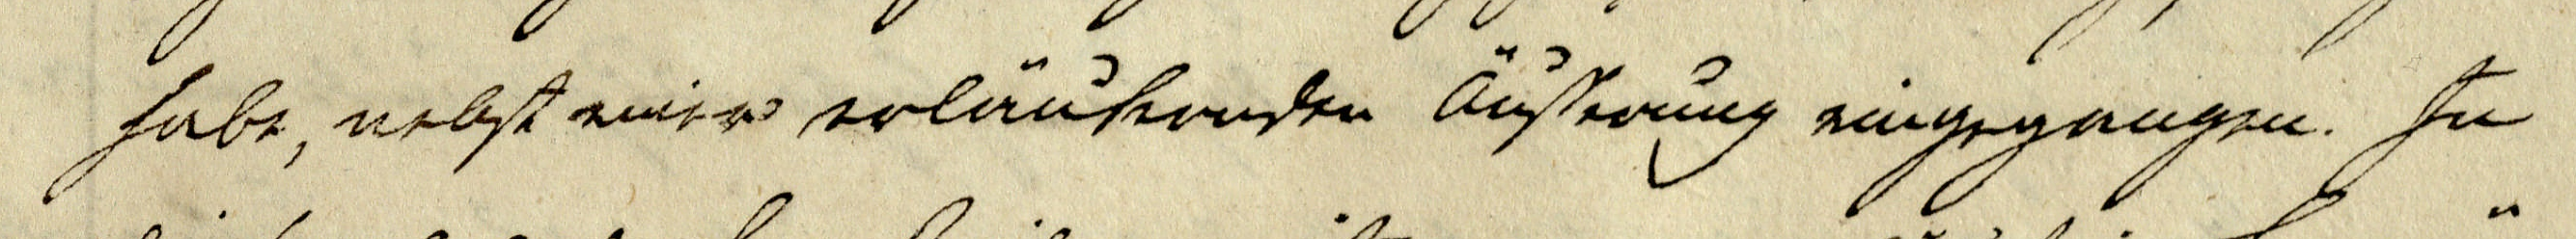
habe, nebst einer erläuternden Äusserung eingegangen. In
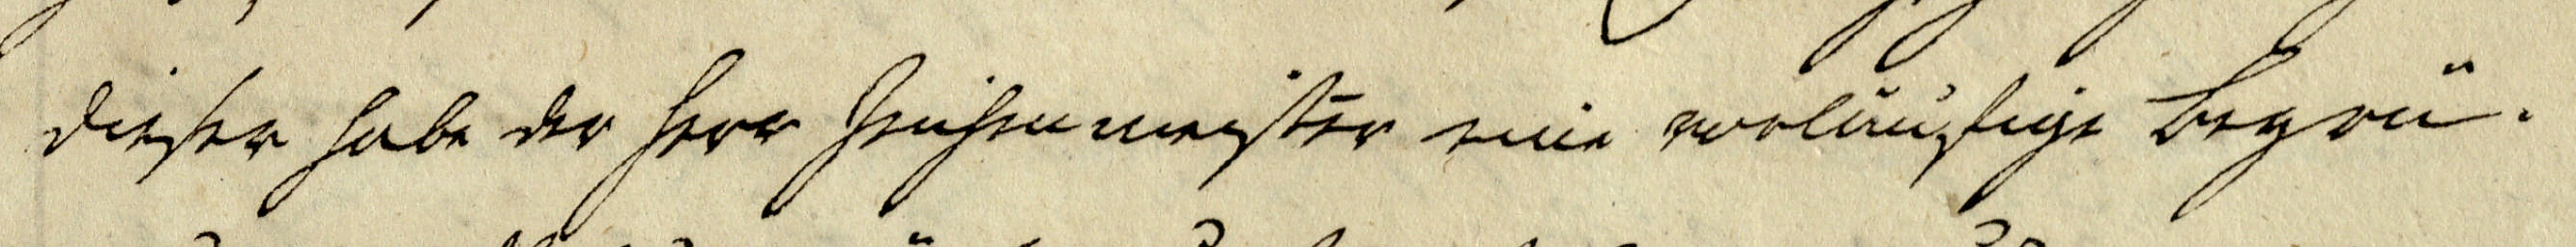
dieser habe der Herr Zeichenmeister eine vorläufige Beprü¬
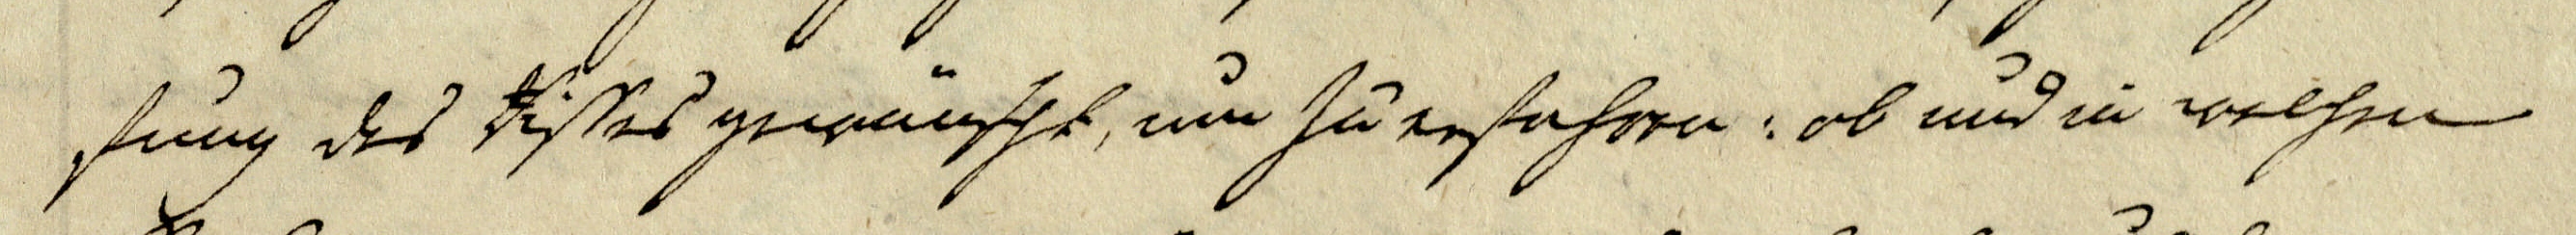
fung des Risses gewünscht, um zu erfahren: ob und in welchen
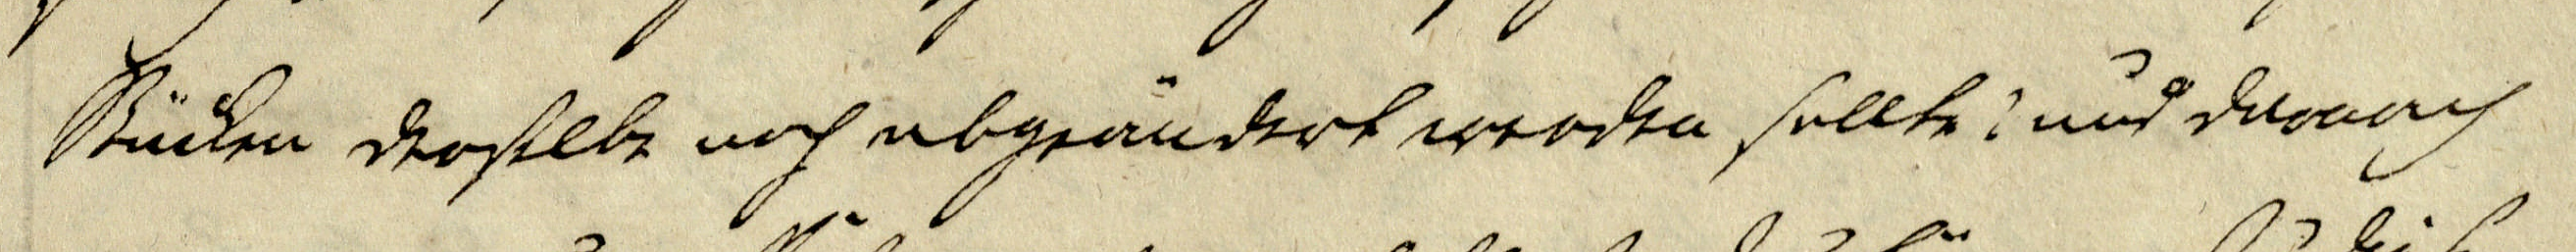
Stücken derselbe noch abgeändert werden sollte: und darnach
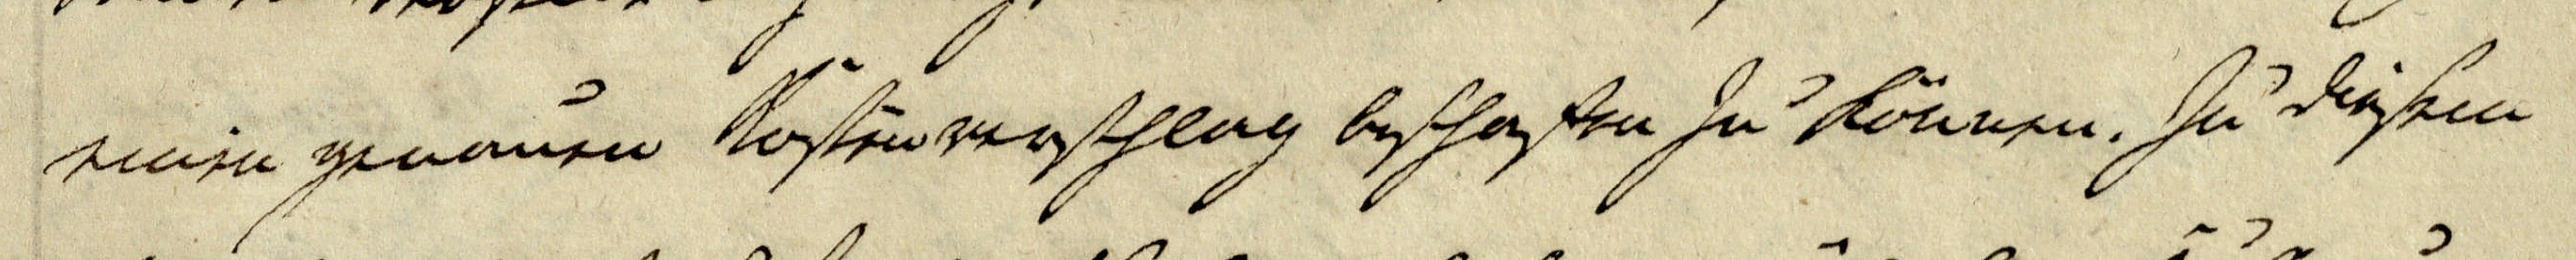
einen genauen Kostenverschlag beschafen zu können. Zu diesem
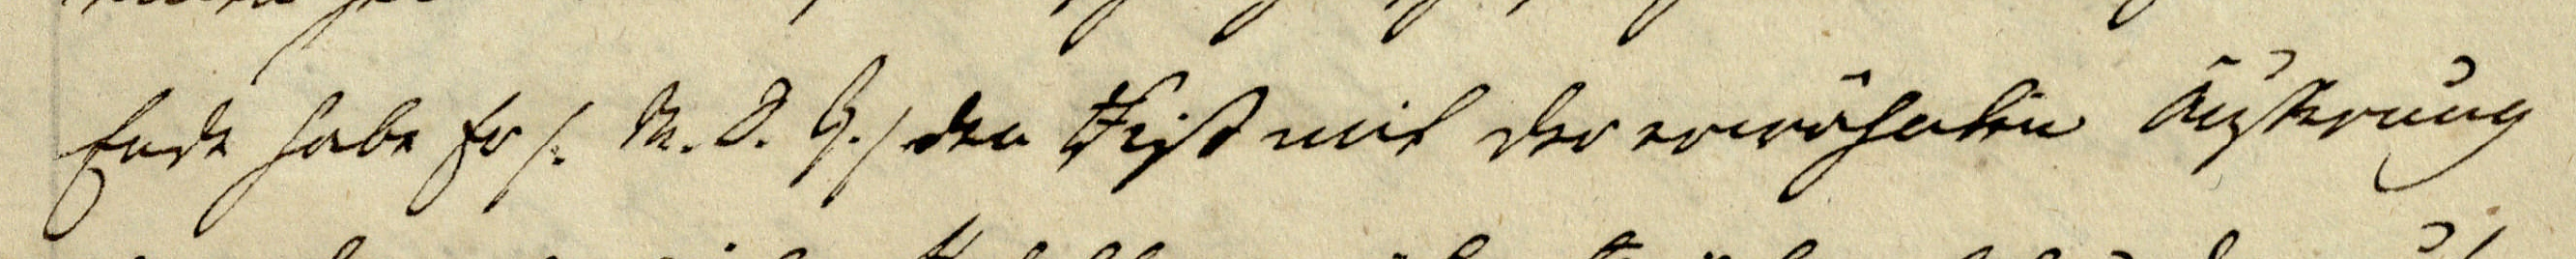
Ende habe Er /. M. D. R./ den Riß mit der erwähnten Äusserung
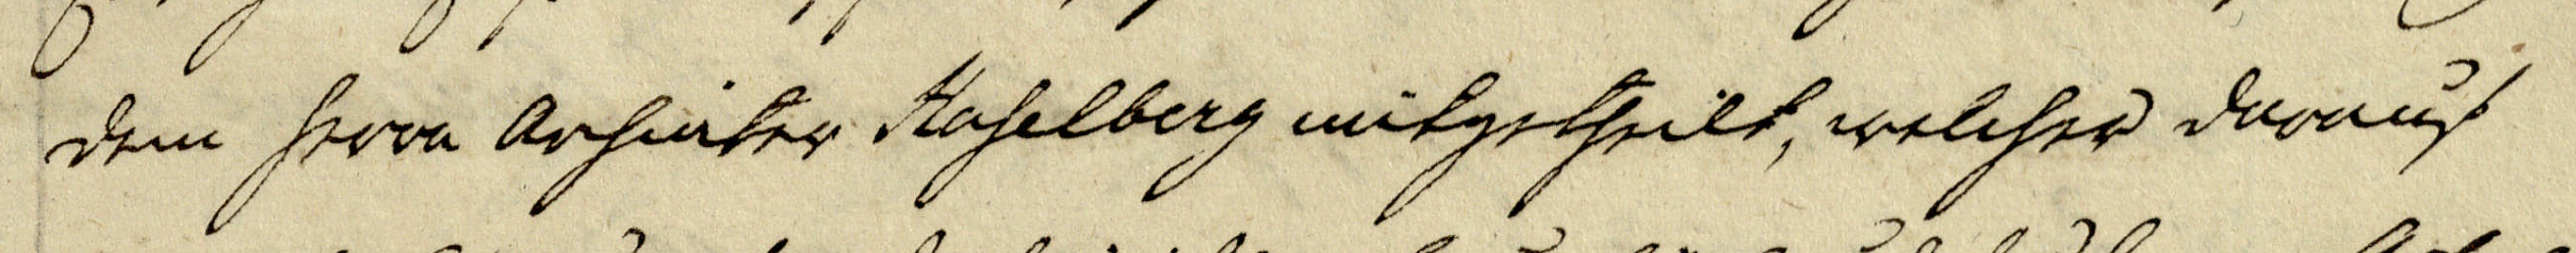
dem Herrn Archiater Haselberg mitgetheilt, welcher darauf
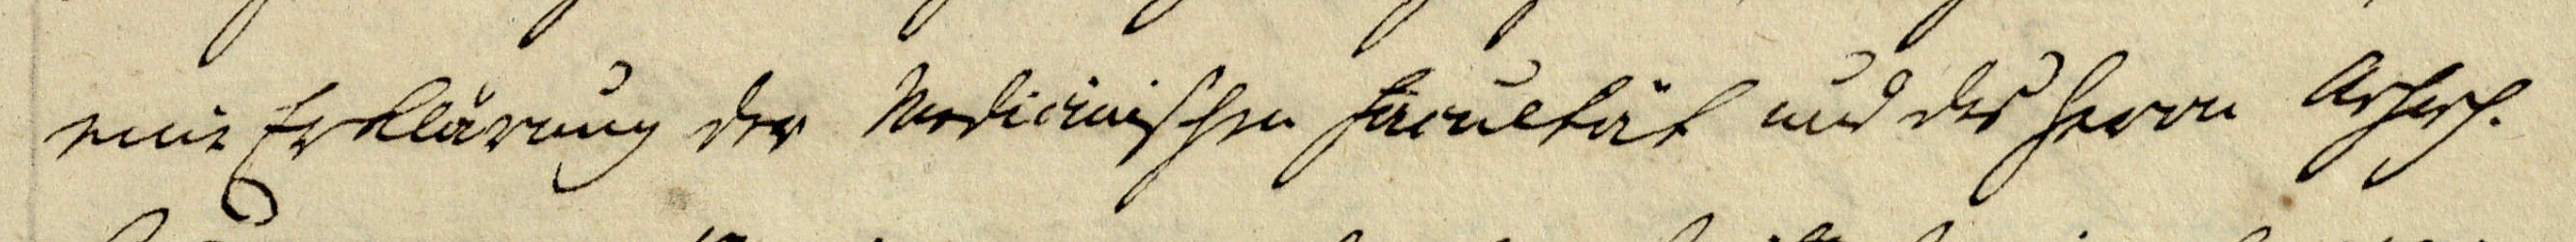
eine Erklärung der Medicinischen Facultät und des Herrn Assess.
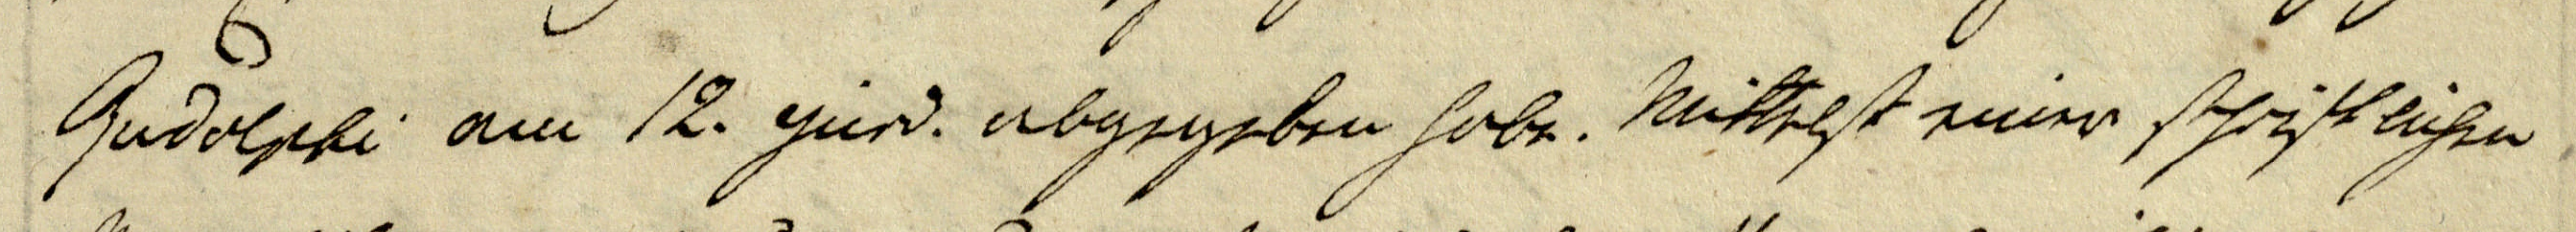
Rudolphi am 12. ejusd. abgegeben habe. Mittelst einer schriftlichen
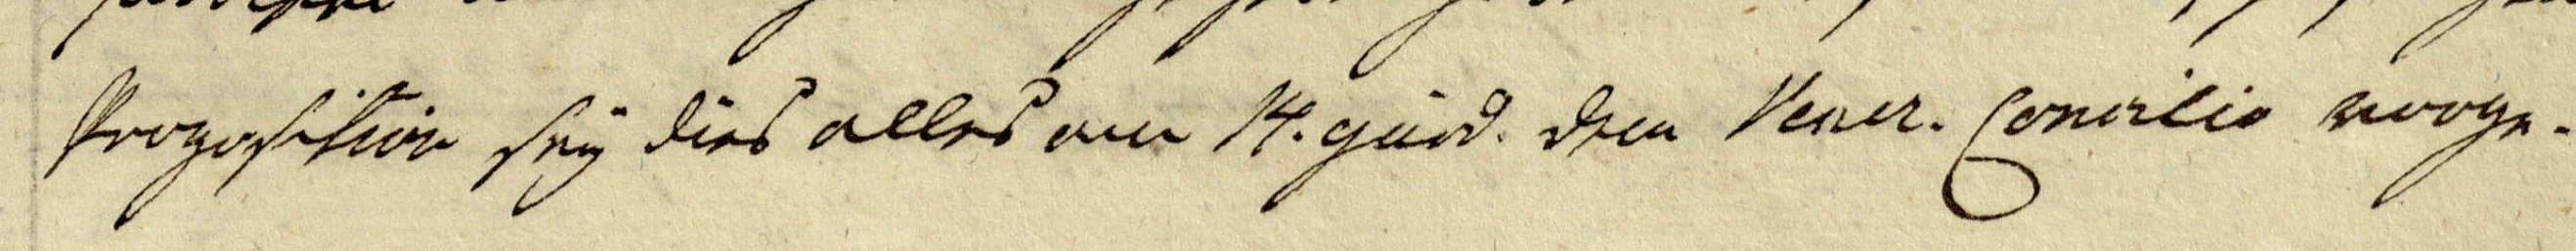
Proposition seÿ dies alles am 14. ejusd. dem Vener. Concilio vorge¬
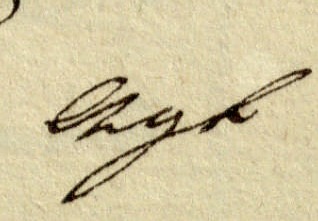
legt
